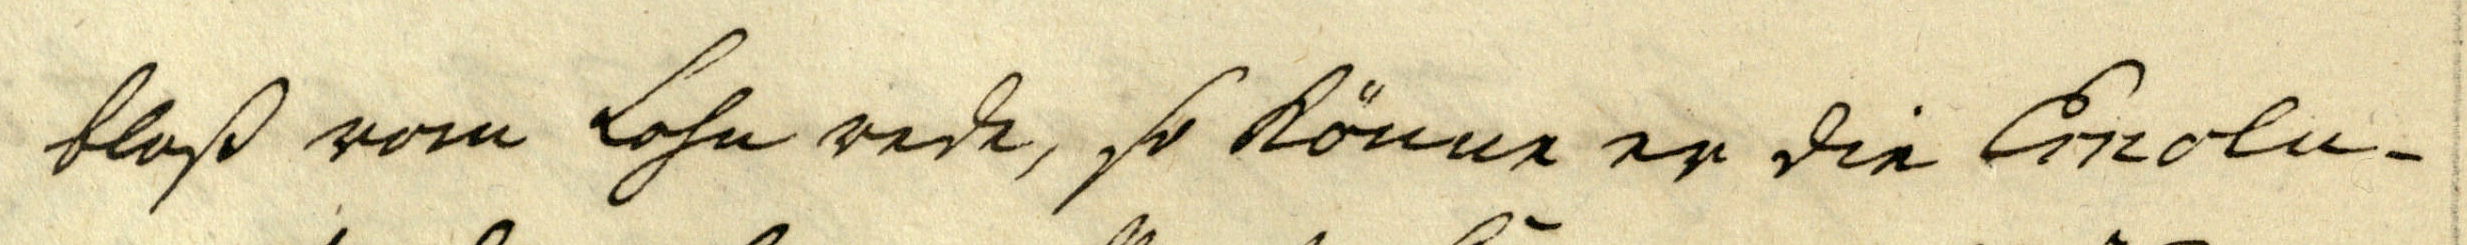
bloß vom Lohn rede, so könne er die Emolu¬
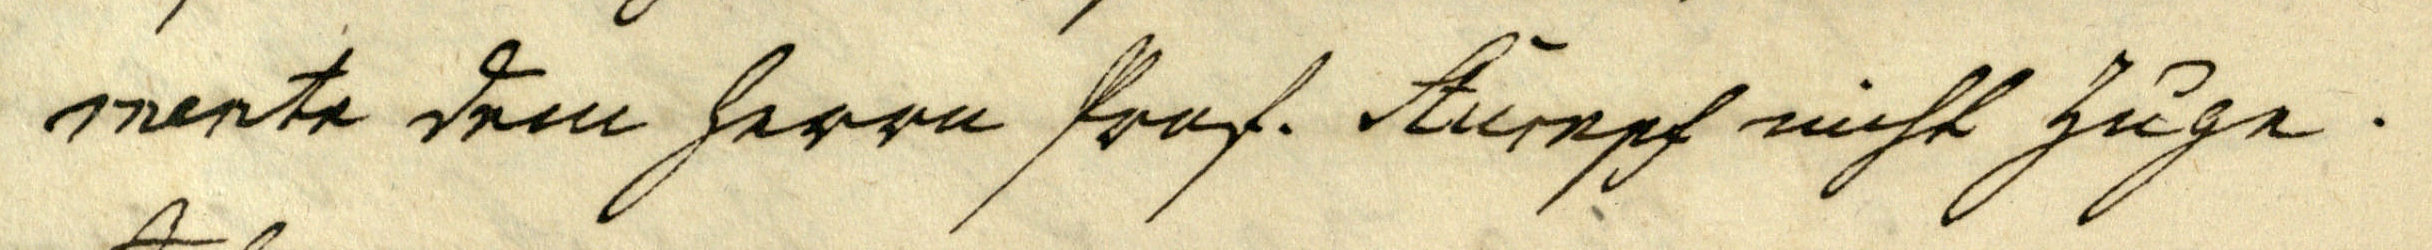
mente dem Herrn Prof. Stumpf nicht zuge¬
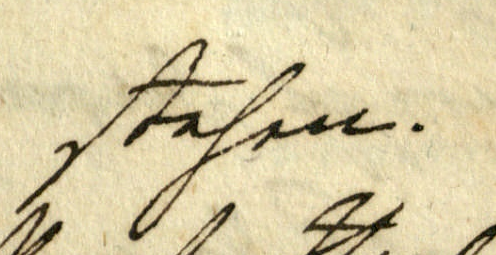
stehen.
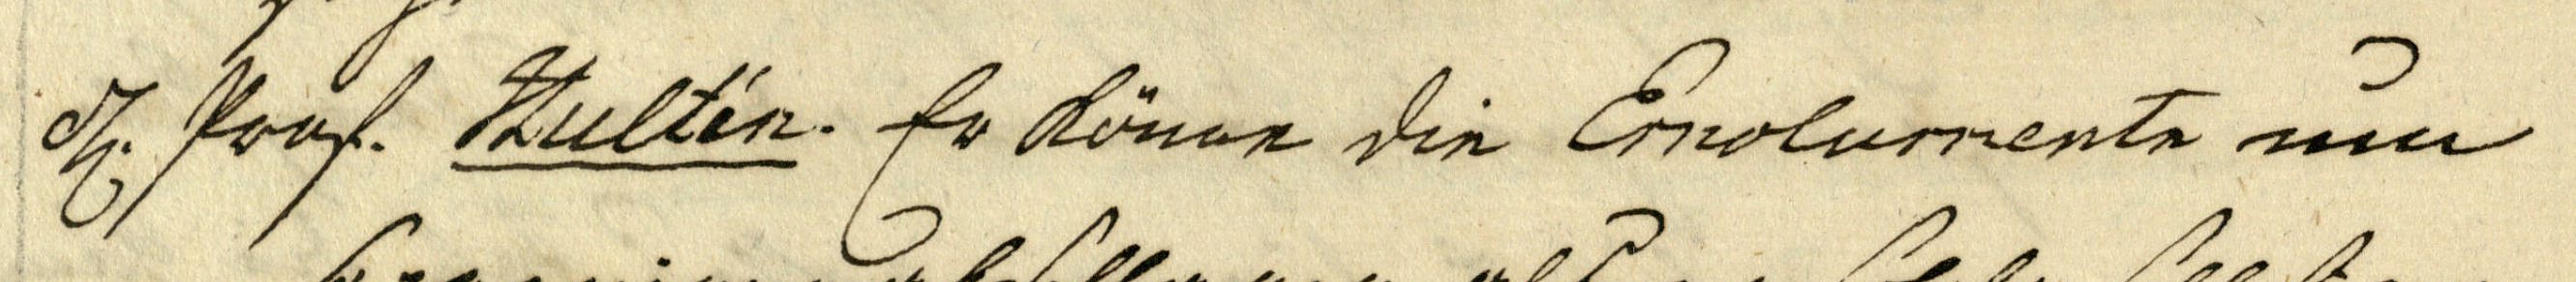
dh. Prof. Hultén. Er könne die Emolumente um
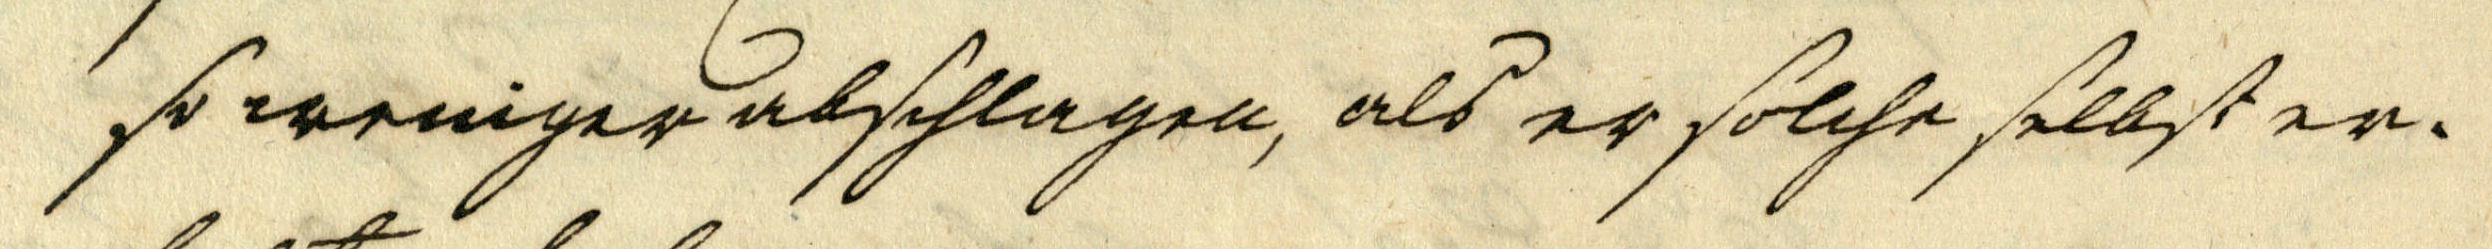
so weniger abschlagen, als er solche selbst er¬
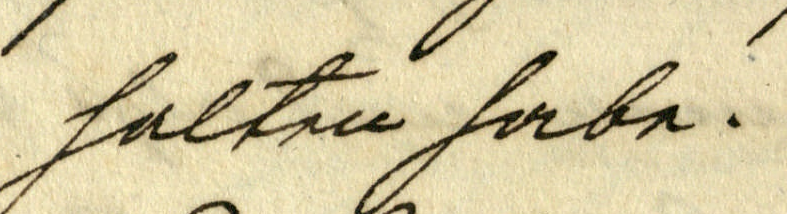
halten habe.
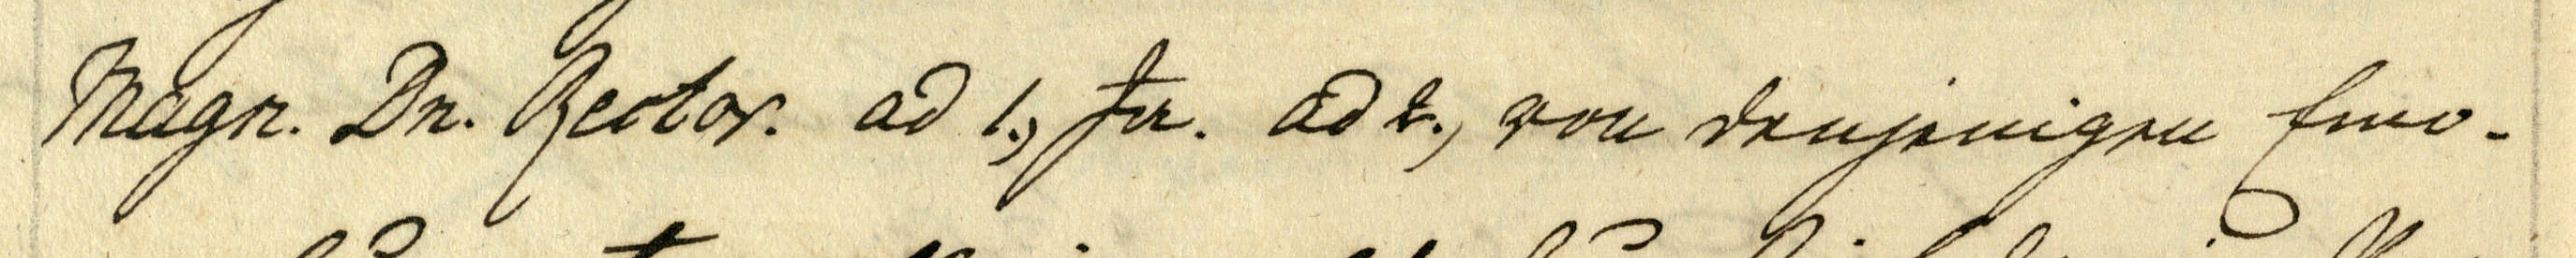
Magn. Dn. Rector. ad 1., Ja. ad 2., von denjenigen Emo¬
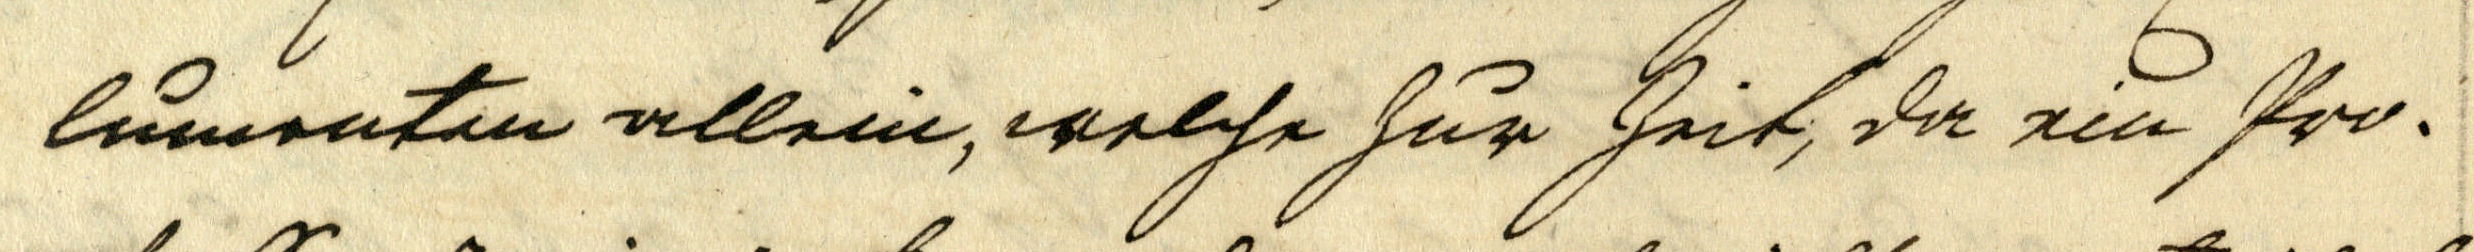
lumenten allein, welche zur Zeit, da ein Pro¬
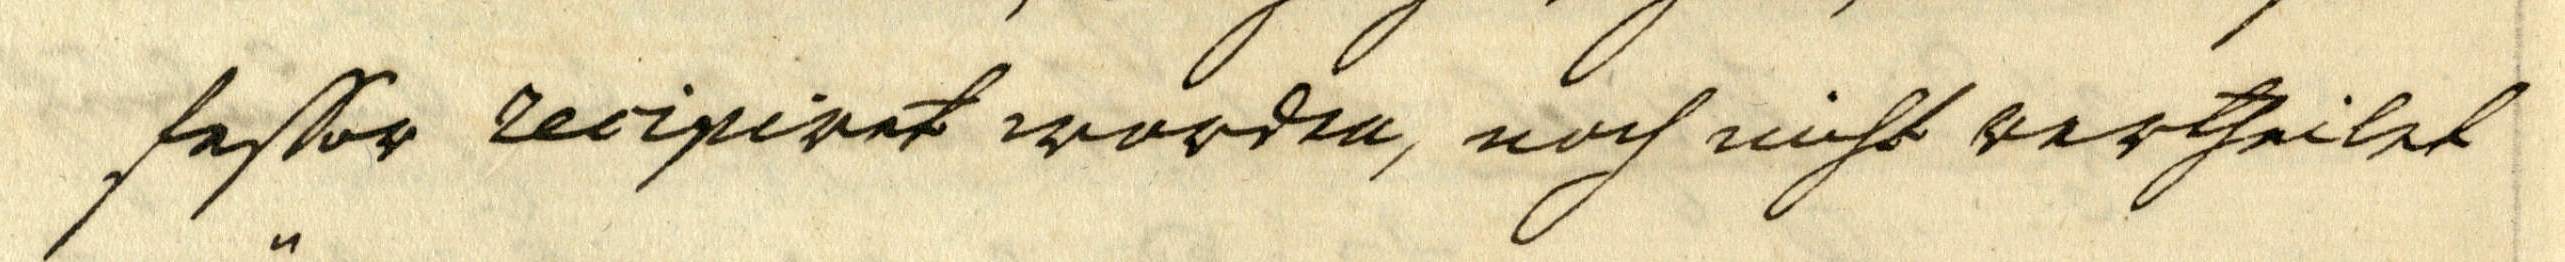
fessor recipiret worden, noch nicht vertheilet
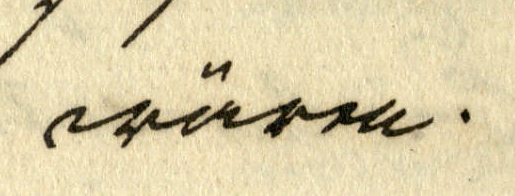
wären.
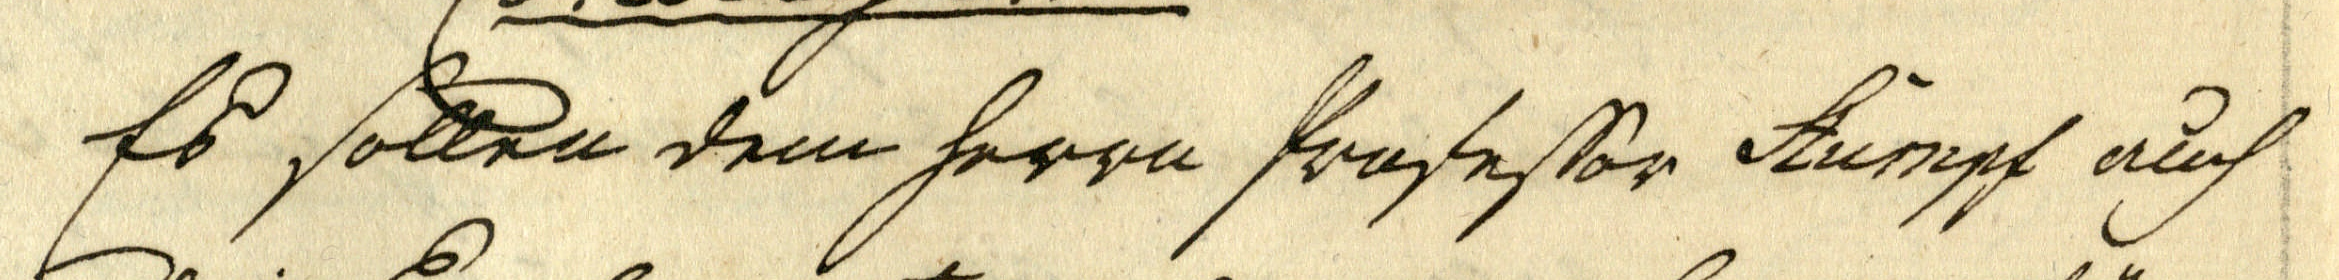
Es sollen dem Herrn Professor Stumpf auch
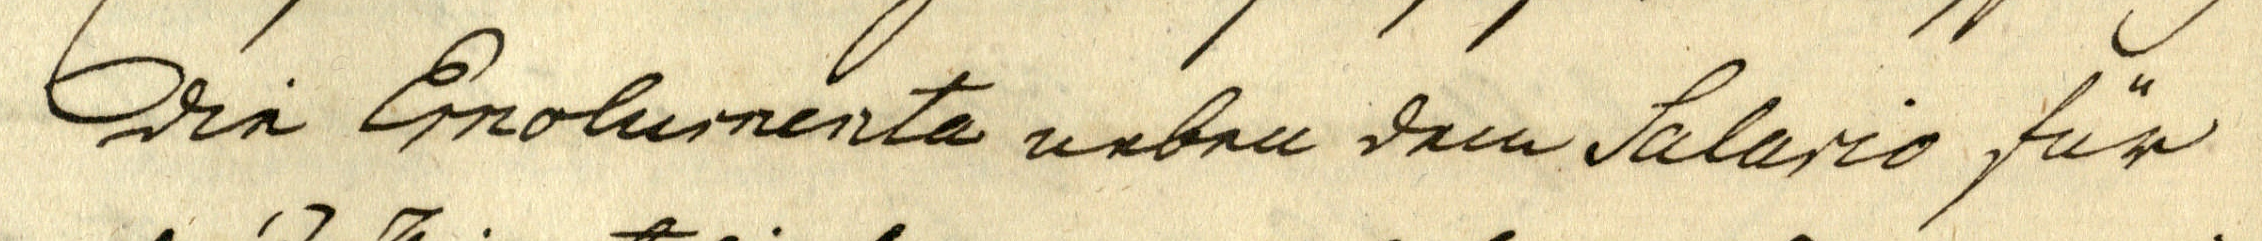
die Emolumenta neben dem Salario für
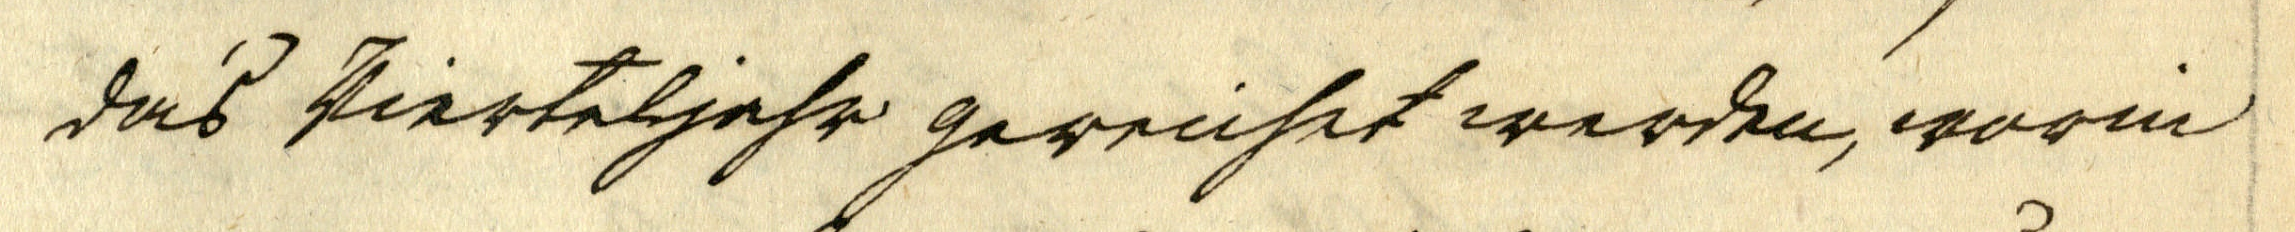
das Vierteljahr gereichet werden, worin
